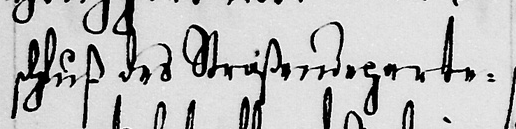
chluß des Straßendeparte¬
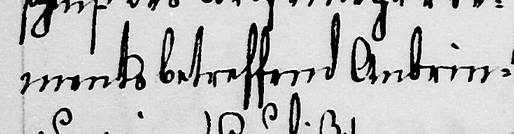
ments betreffend Anbrin¬
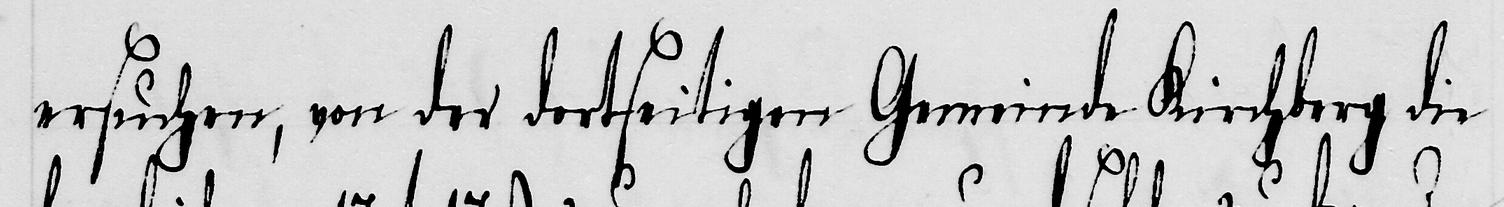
ersuchen, von der dortseitigen Gemeinde Kirchberg die
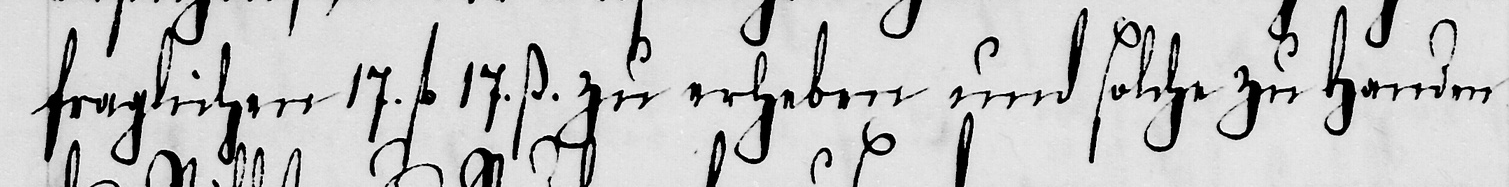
fraglichen 17. fl. 17. ß. zu erheben und solche zu Handen
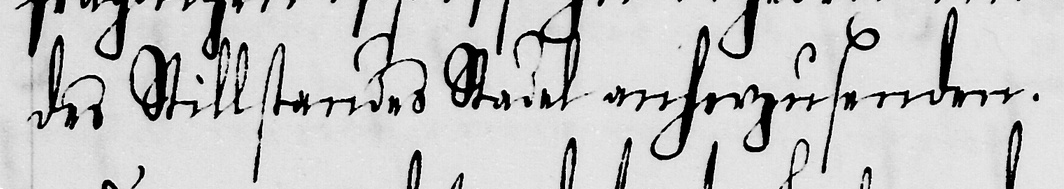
des Stillstandes Stadel anherzusenden.
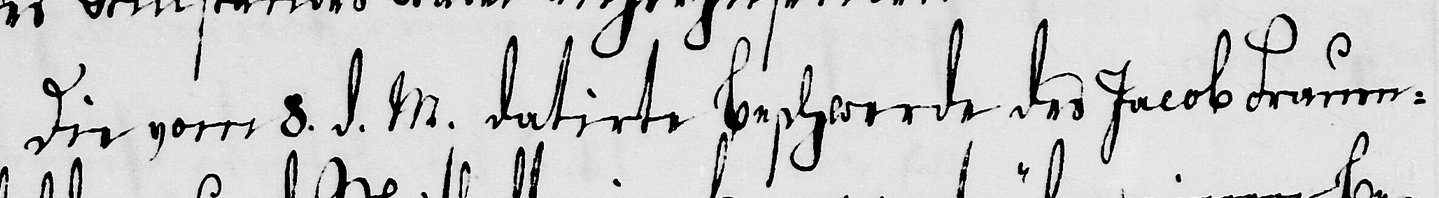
Die vom 8. d. M. datirte Beschwerde des Jacob Frauen¬
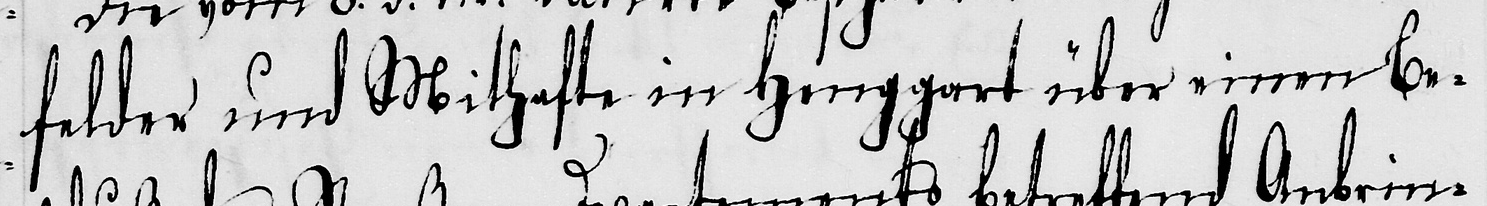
felder und Mithafte in Henggart über einen Bes¬
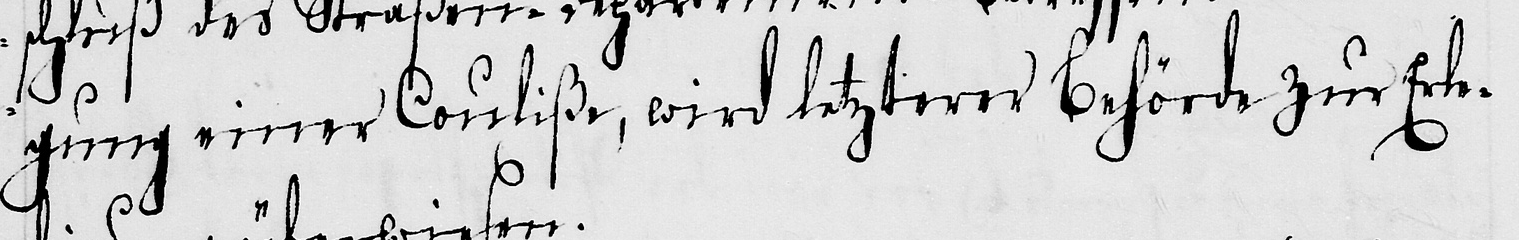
gung einer Couliße, wird letzterer Behörde zur Erle¬
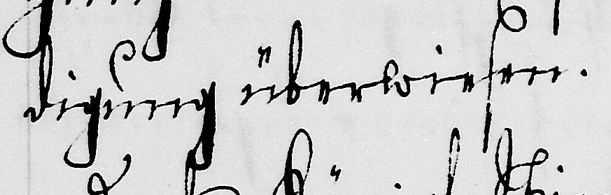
digung überwiesen.
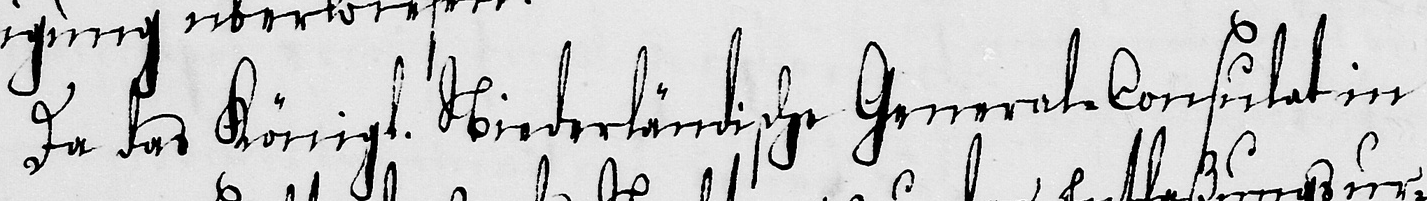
Da das Königl. Niederländische General-Consulat in
